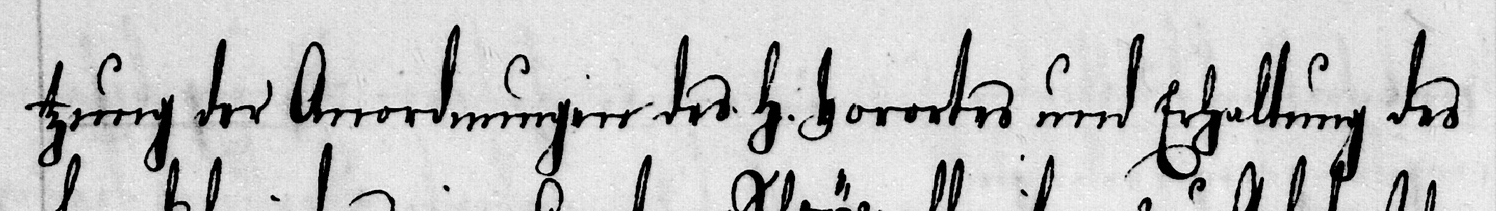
tzung der Anordnungen des H. Vorortes und Erhaltung des
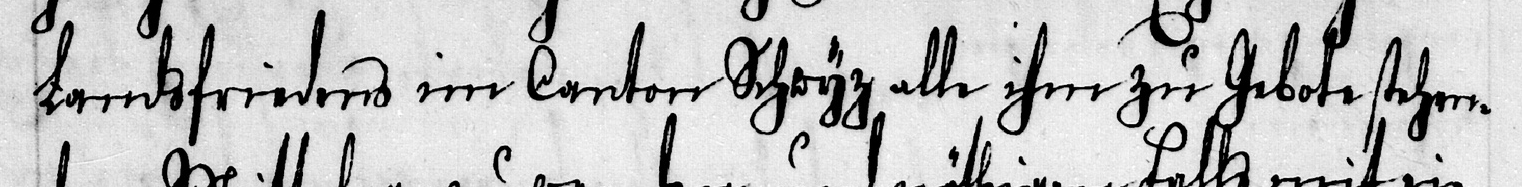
Landsfriedens im Canton Schwyz alle ihm zu Gebote stehen¬
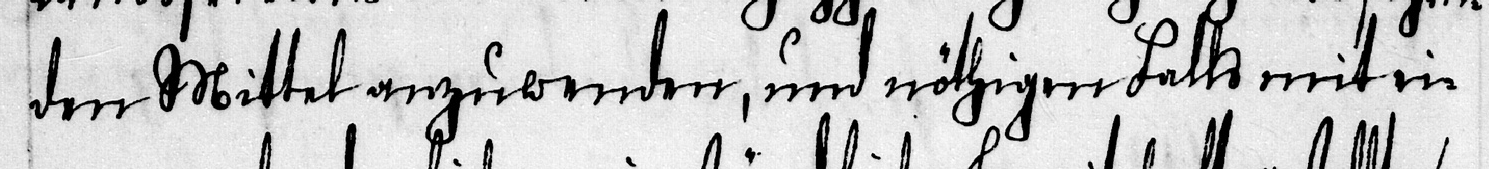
den Mittel anzuwenden, und nöthigen Falls mit ei¬
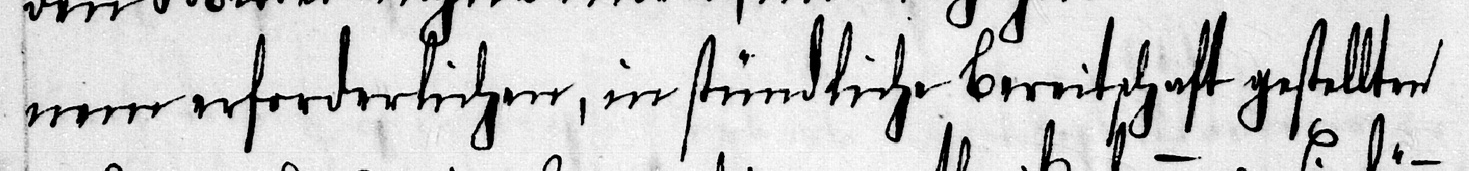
nem erforderlichen, in stündliche Bereitschaft gestellten
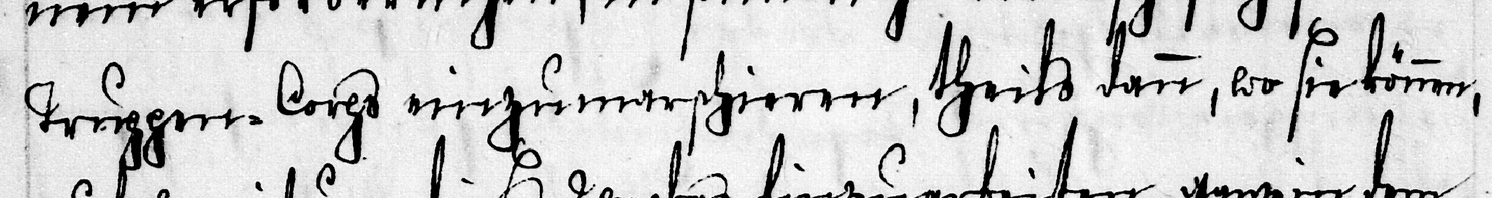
Truppen-Corps einzumarschieren, theils dann, wo sie können,
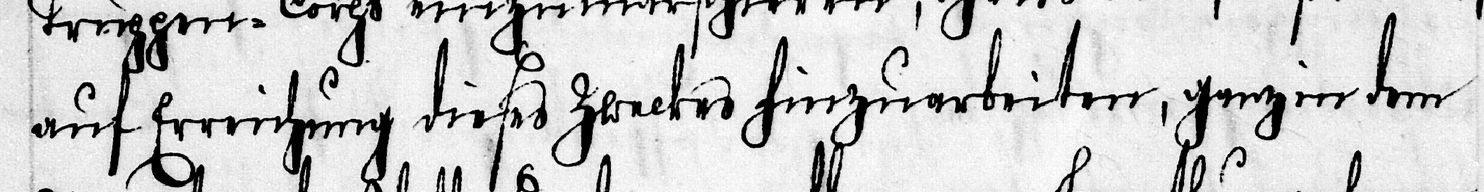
auf Erreichung dieses Zwecks hinzuarbeiten, ganz in dem
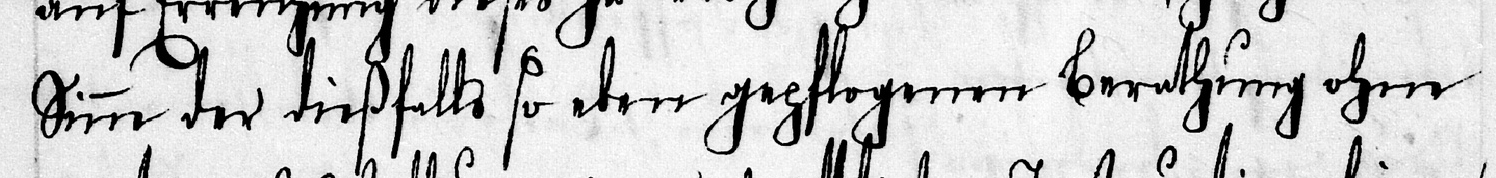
Sinne der dießfalls so eben gepflogenen Berathung ohne
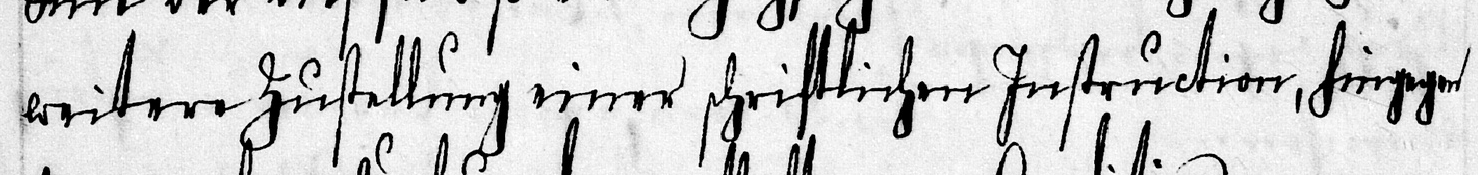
weitere Zustellung einer schriftlichen Instruction, hingeg¬
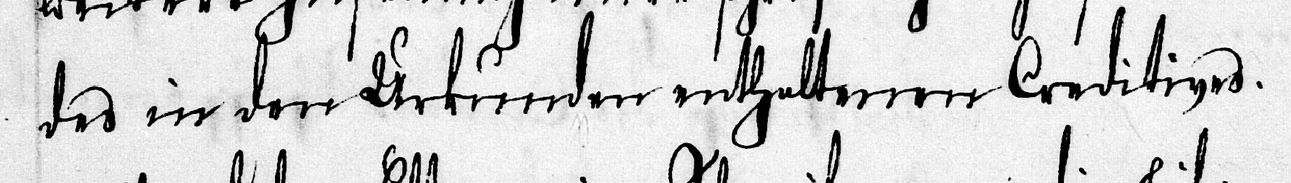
des in den Urkunden enthaltenen Creditives.
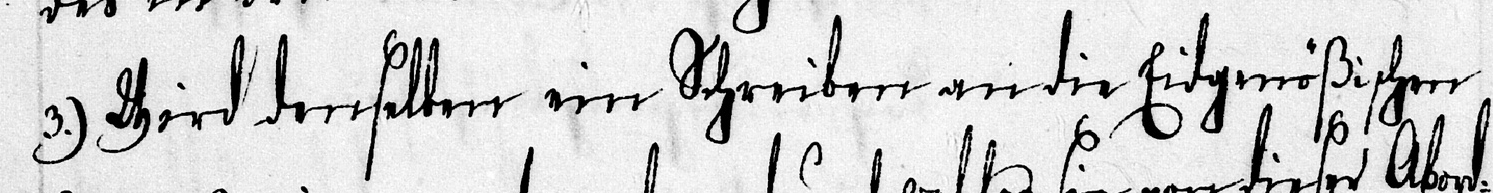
3.) Wird denselben ein Schreiben an die Eidgenößischen
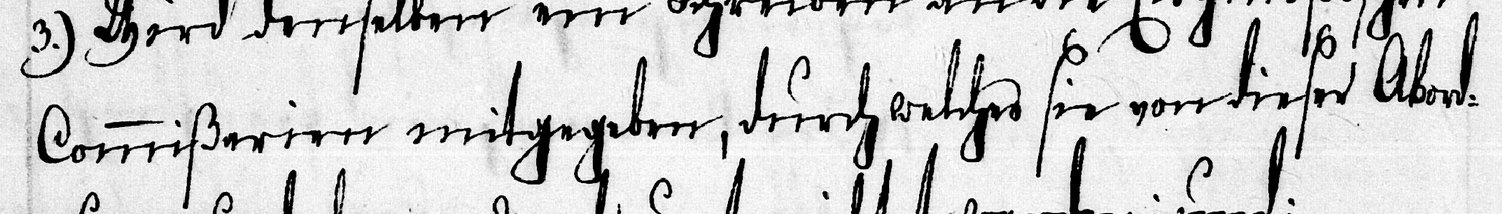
Commißarien mitgegeben, durch welches sie von dieser Abor¬
